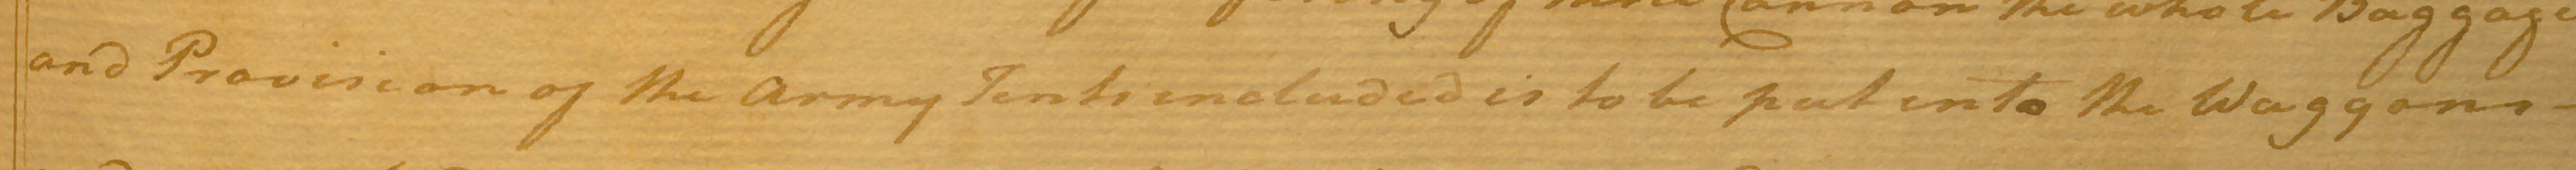and Provision of the Army Tents included is to be put into the Waggons-
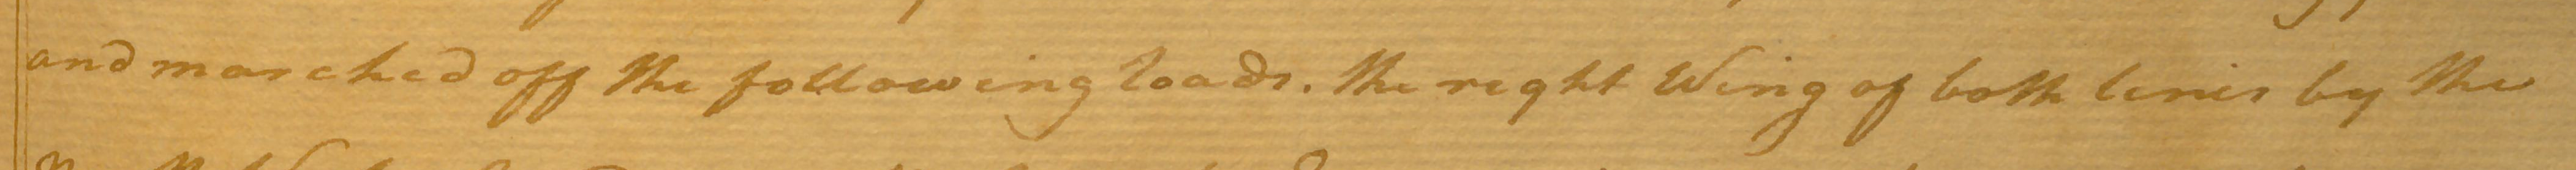and marched off the following loads. the right Wing of both lines by the
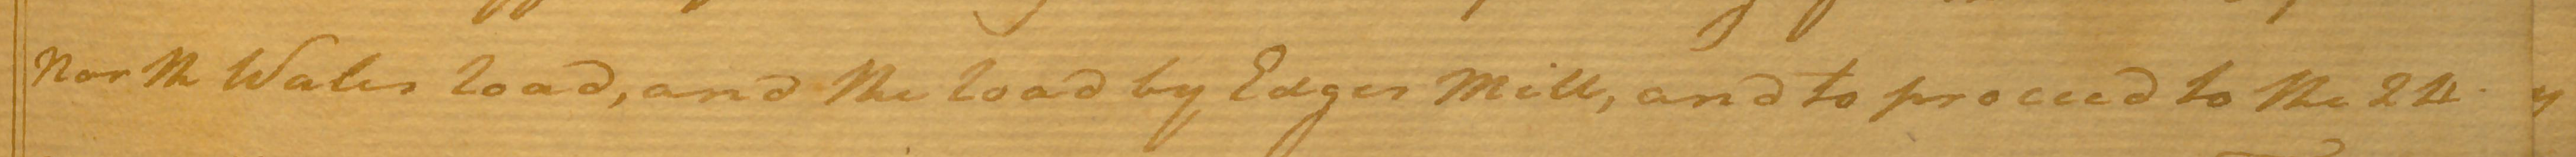North Wales road, and the road by Edger Mill, and to proceed to the 24
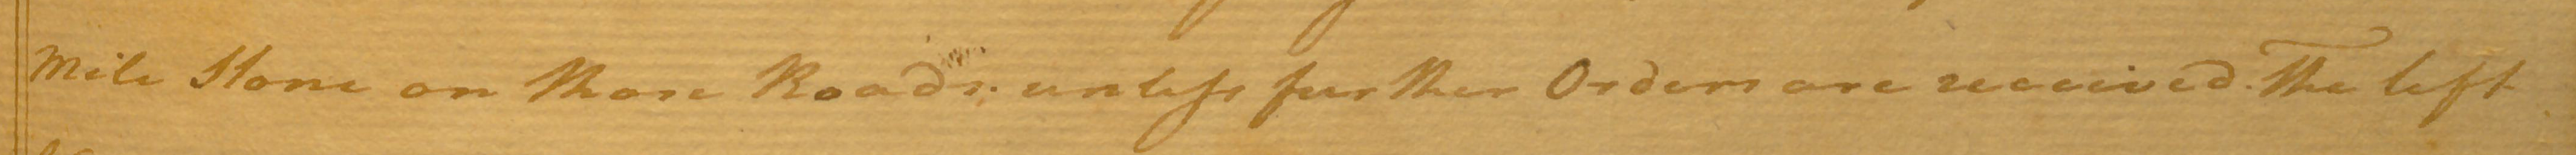Mile Stone on those Roads; unless further Orders are received. The left
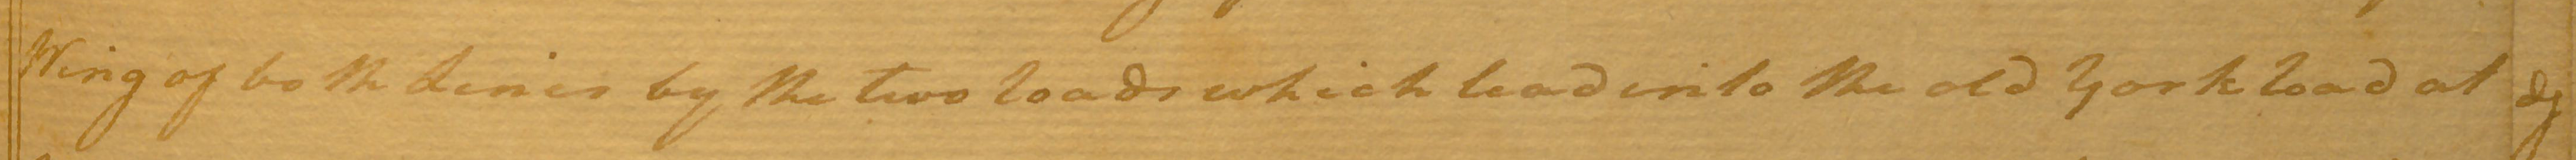Wing of both Lines by the two roads which lead into the old York road at
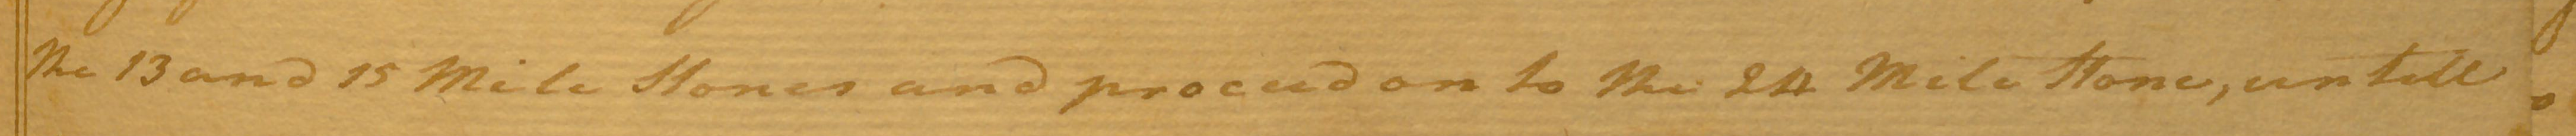the 13 and 15 Mile Stones and proceed on to the 24 mile Stone, untill
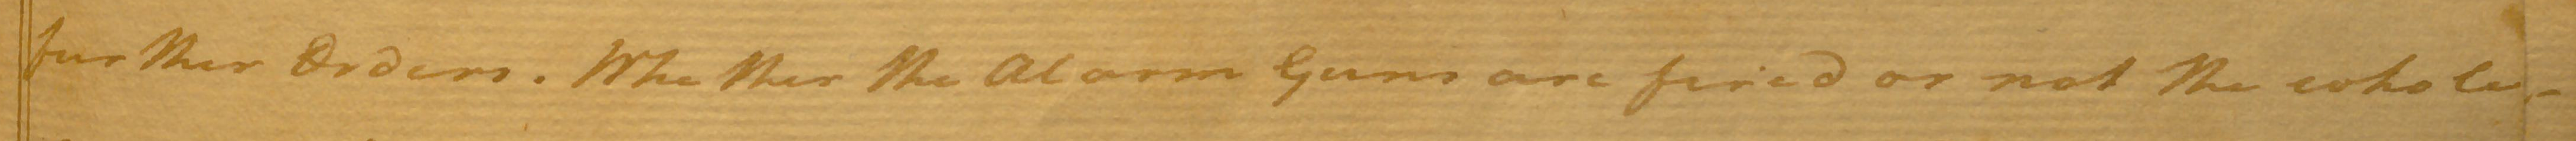further Orders. Whether the Alarm Guns are fired or not the whole
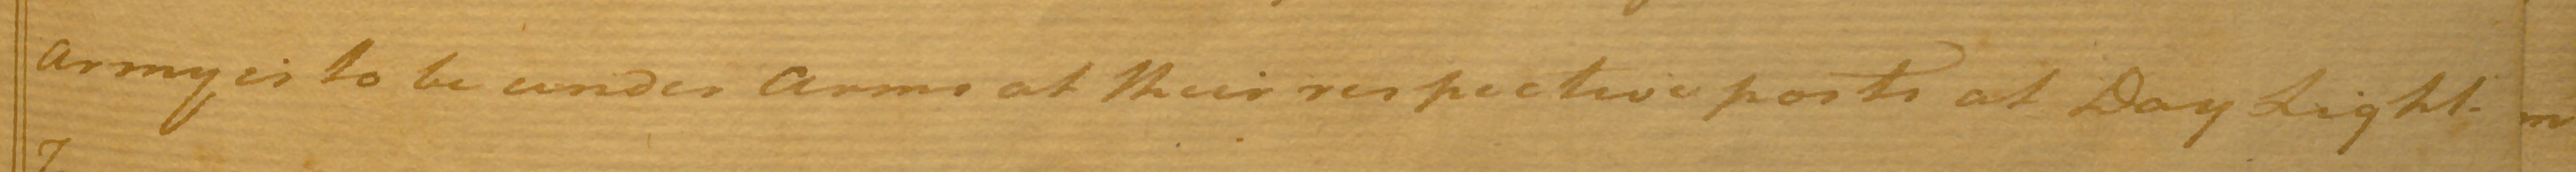Army is to be under Arms at their respective posts at Day Light.
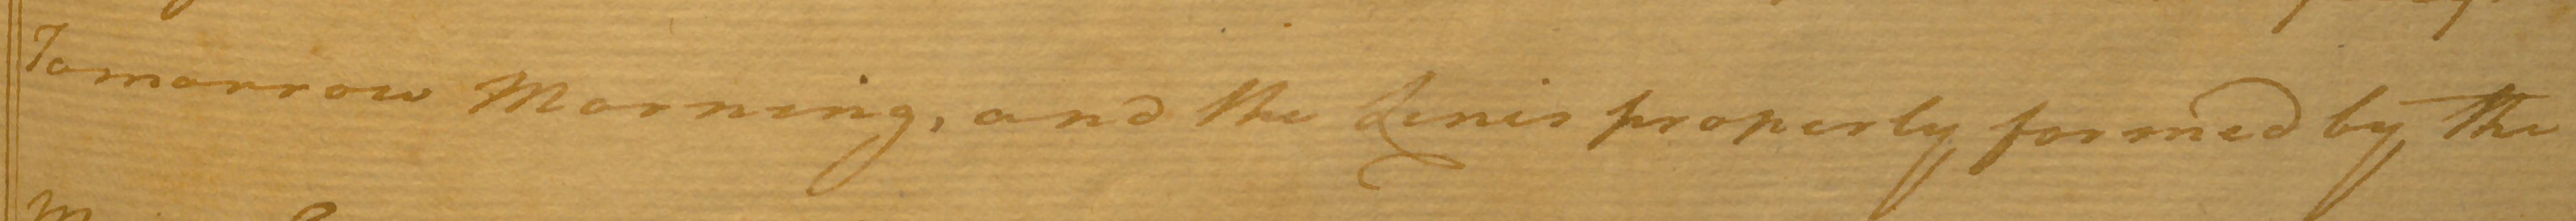Tomorrow Morning, and the Lines properly formed by the
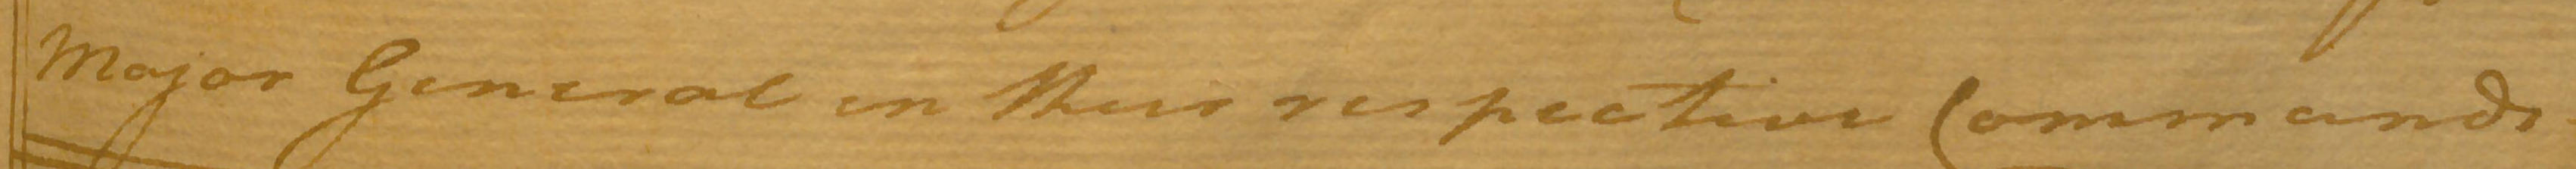Major General in their respective Commands
